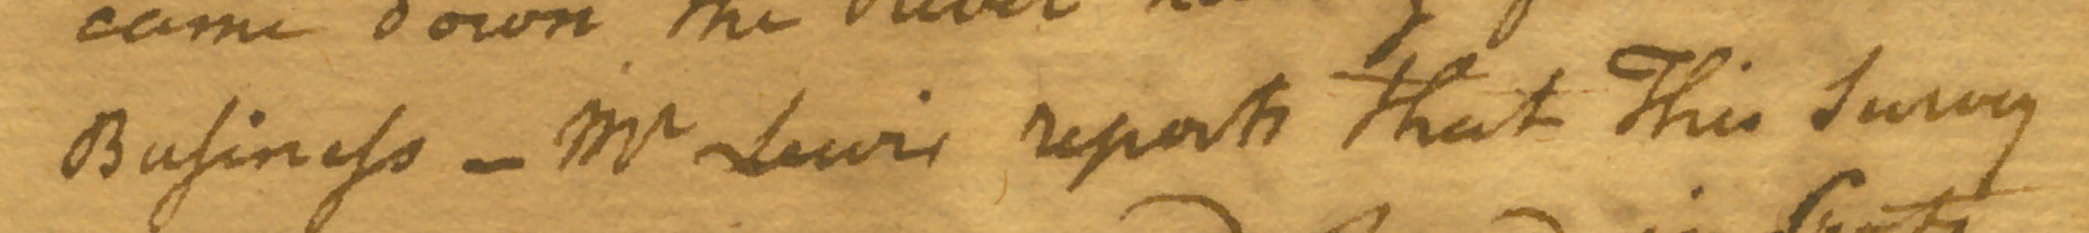Business- M^r Lewis reports that This survey
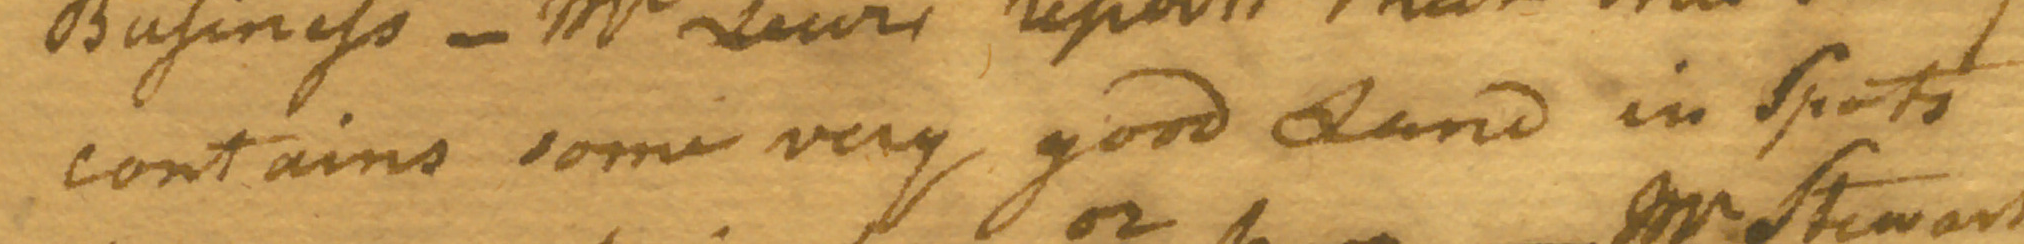contains some very good Land in spots
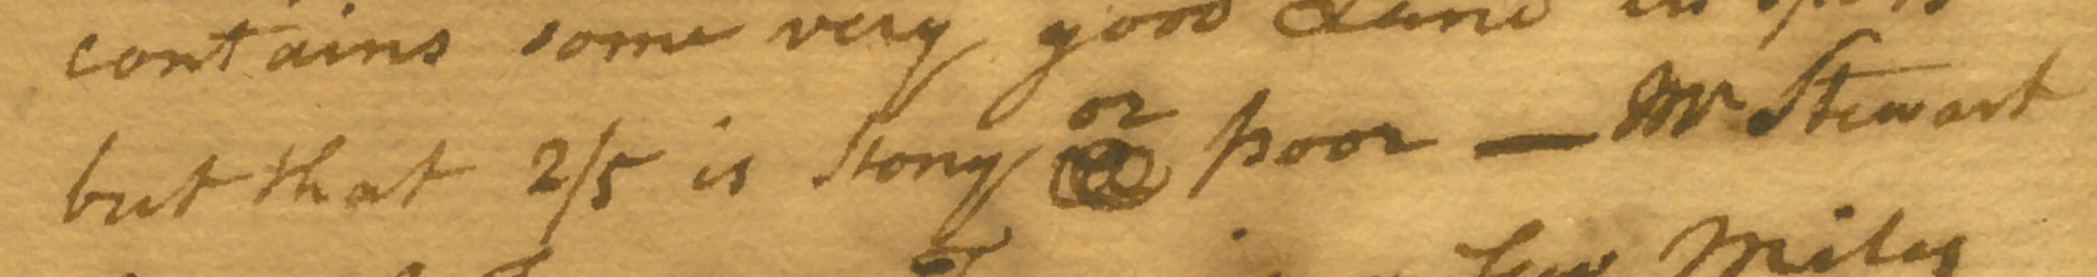but that 2/5 is Stony [_] ^or poor- Mr Stewart
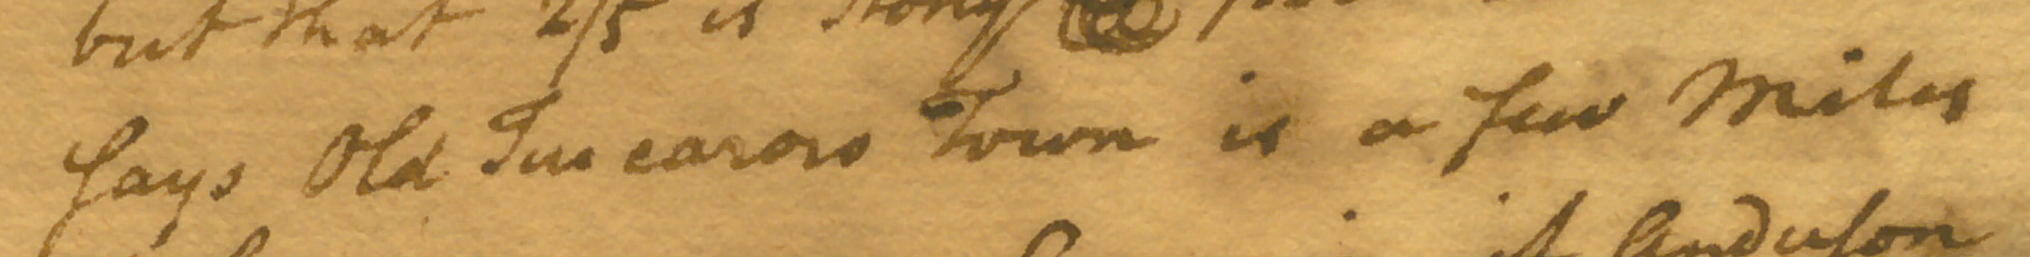says Old Tuscaroro Town is a few Miles
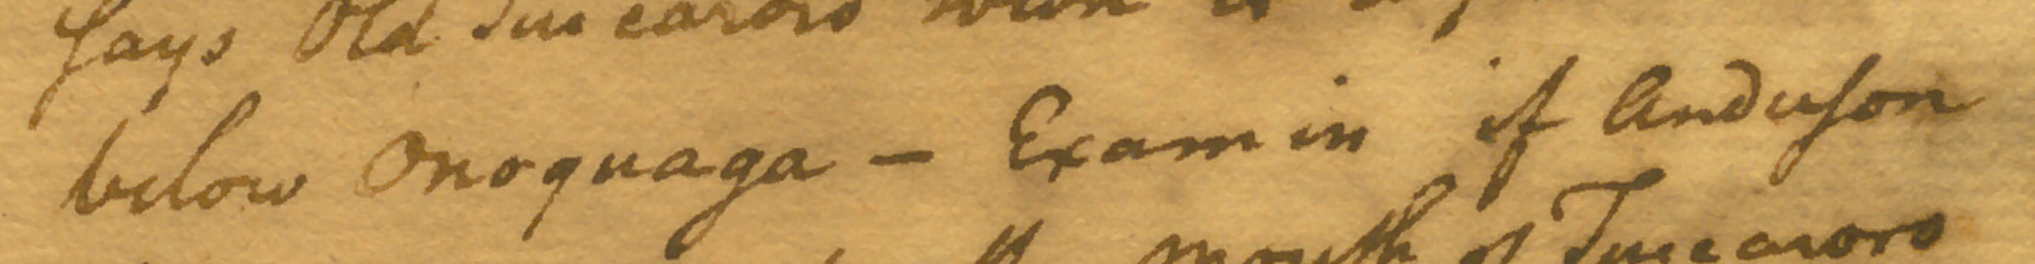below Onoquaga- Examin if Anderson
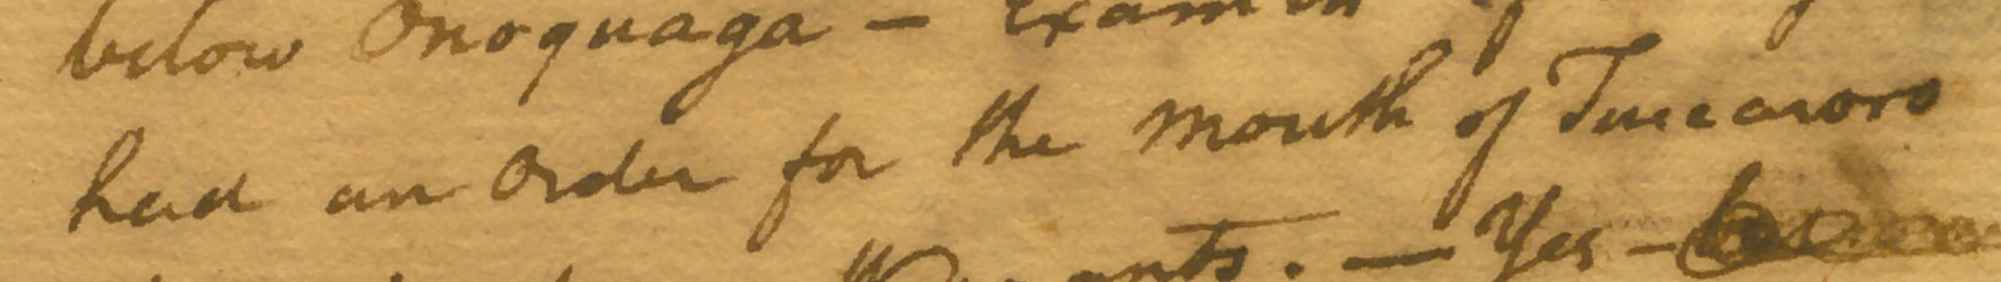had an order for the mouth of Tuscaroro
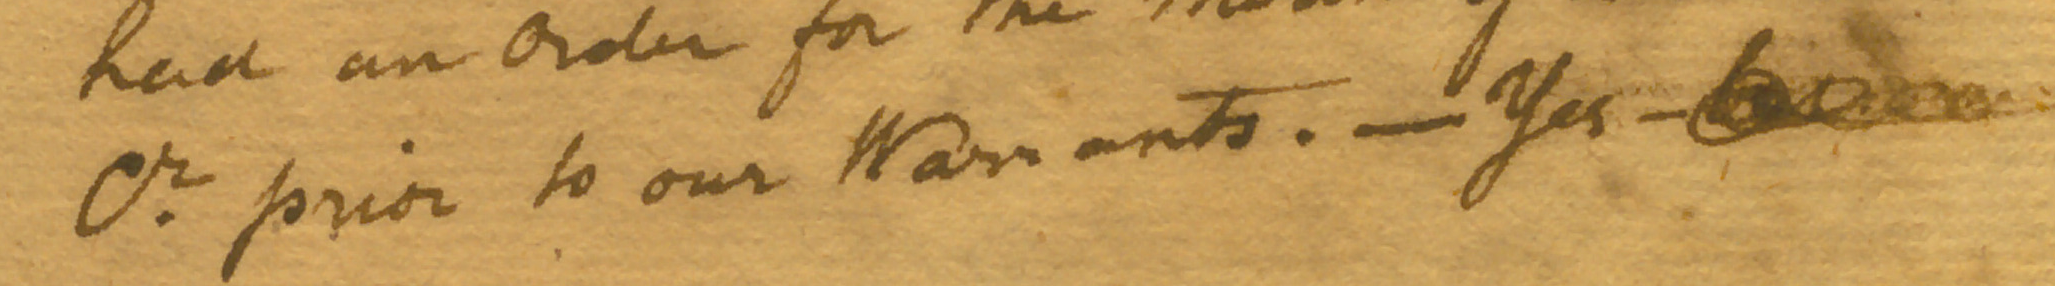C^r. prior to our Warrants.- Yes- [_____]
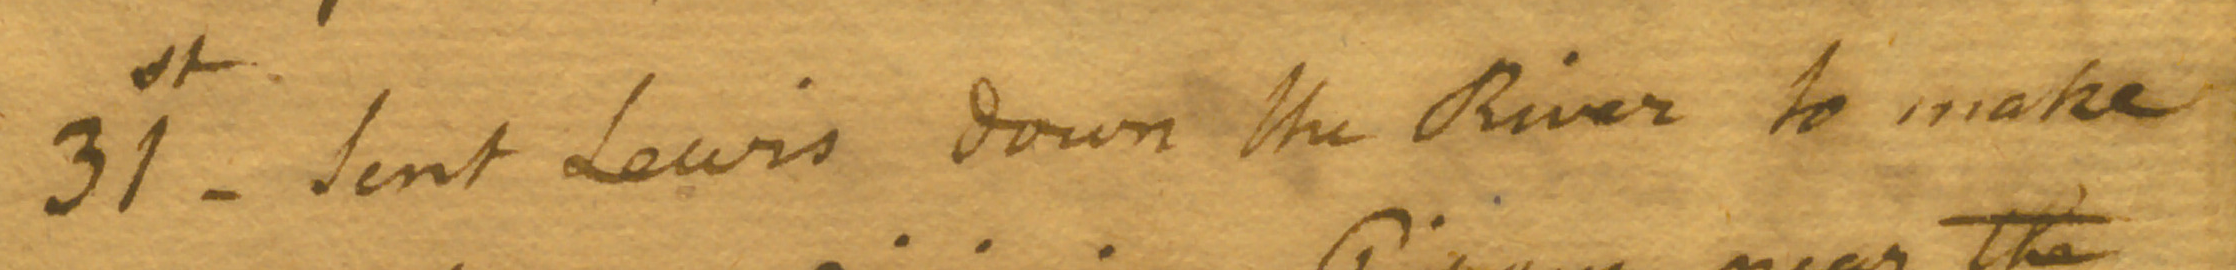31^st- Sent Lewis down the River to make
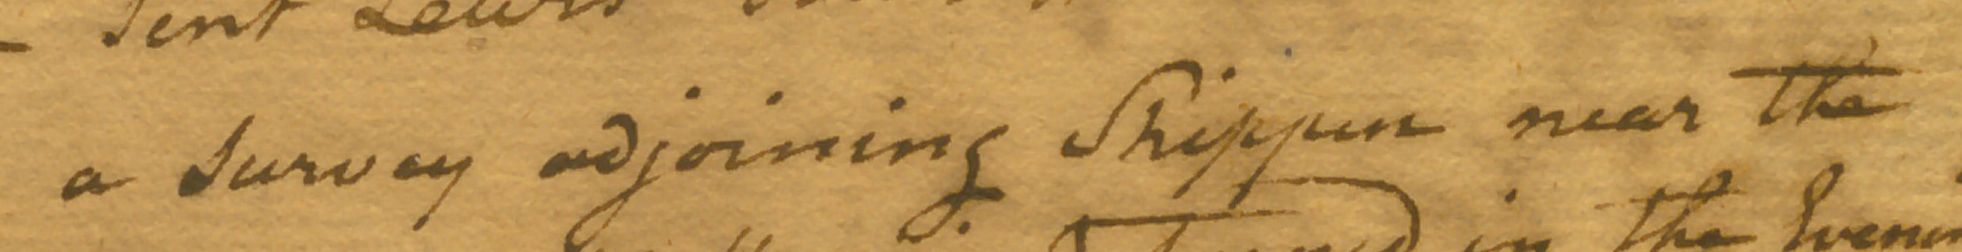a survey adjoining Shippen near the
